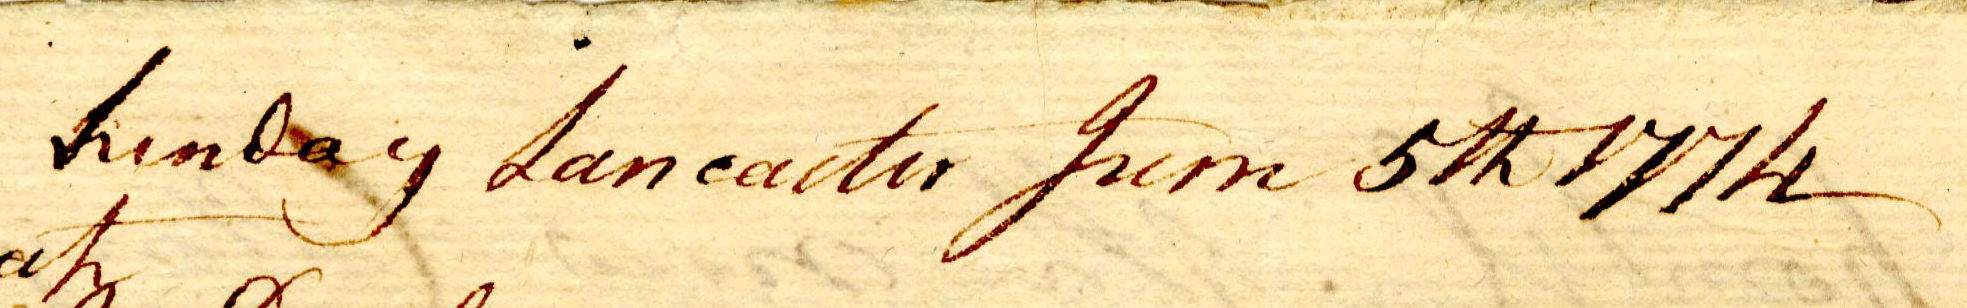Sunday Lancaster June 5th 1774
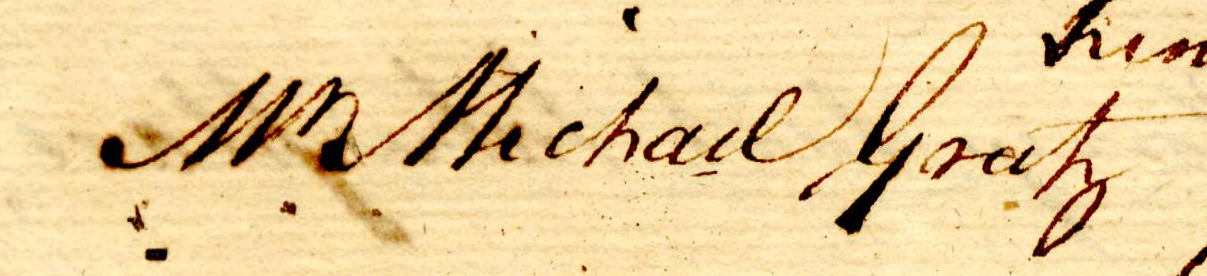M^r Michael Gratz
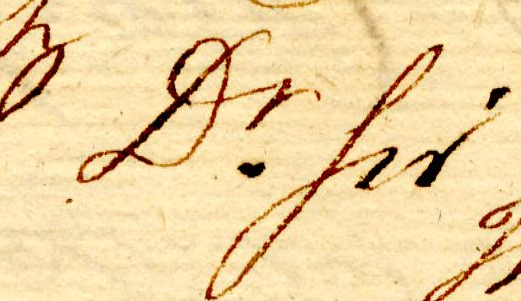D^r. Sir
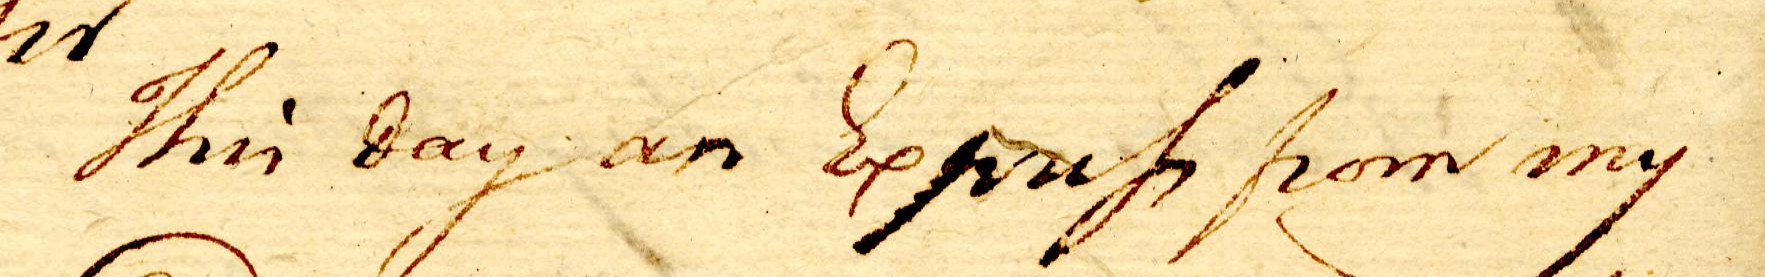This day an Express from my
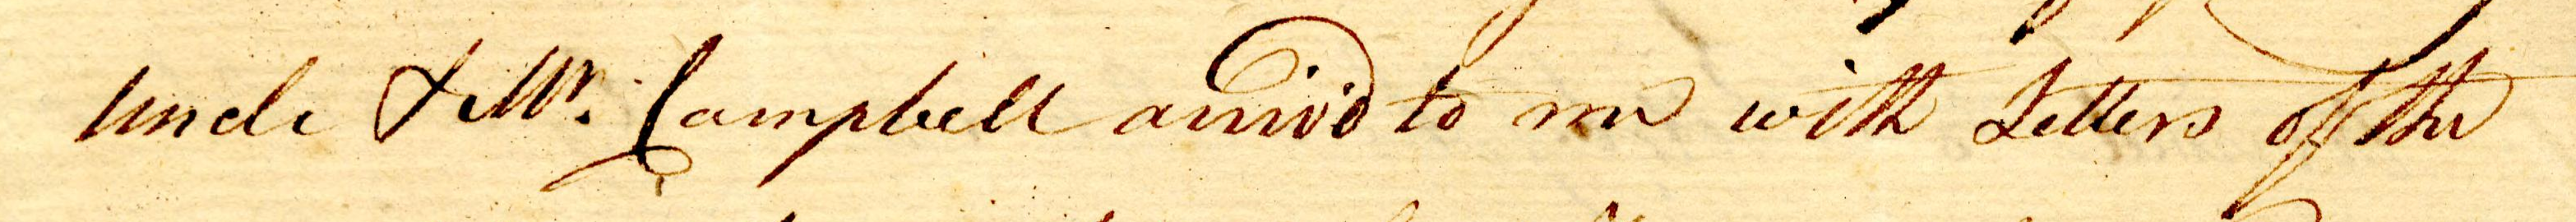Uncle & M^r. Campbell arriv'd to me with Letters of the
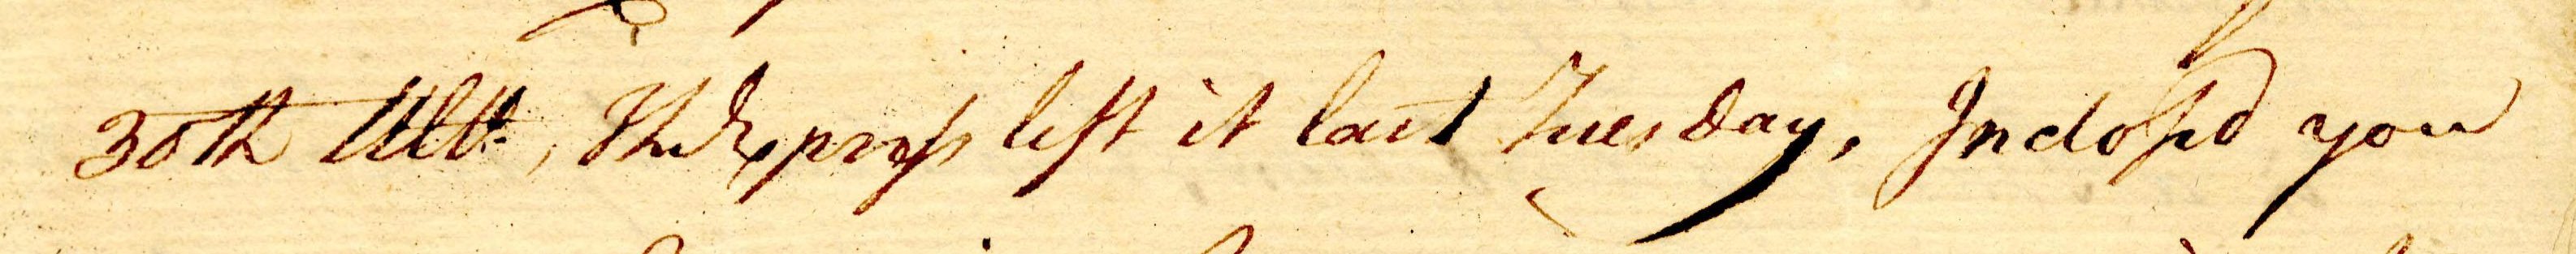30th Ult^o., the Express left it last tuesday, Inclos'd you
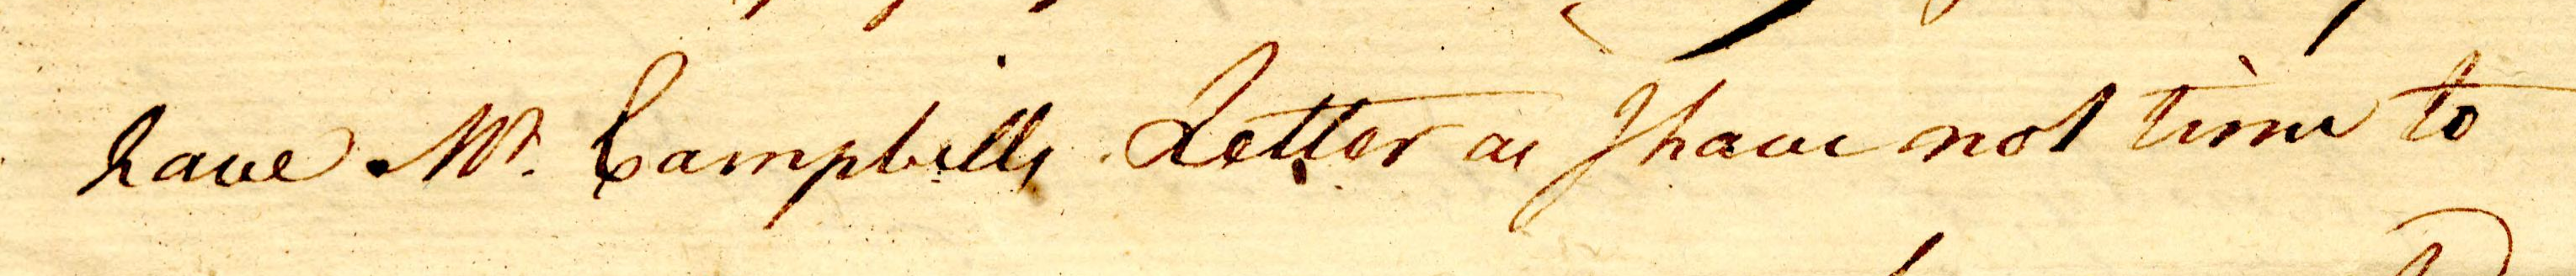have M^r. Campbells Letter as I have not time to
